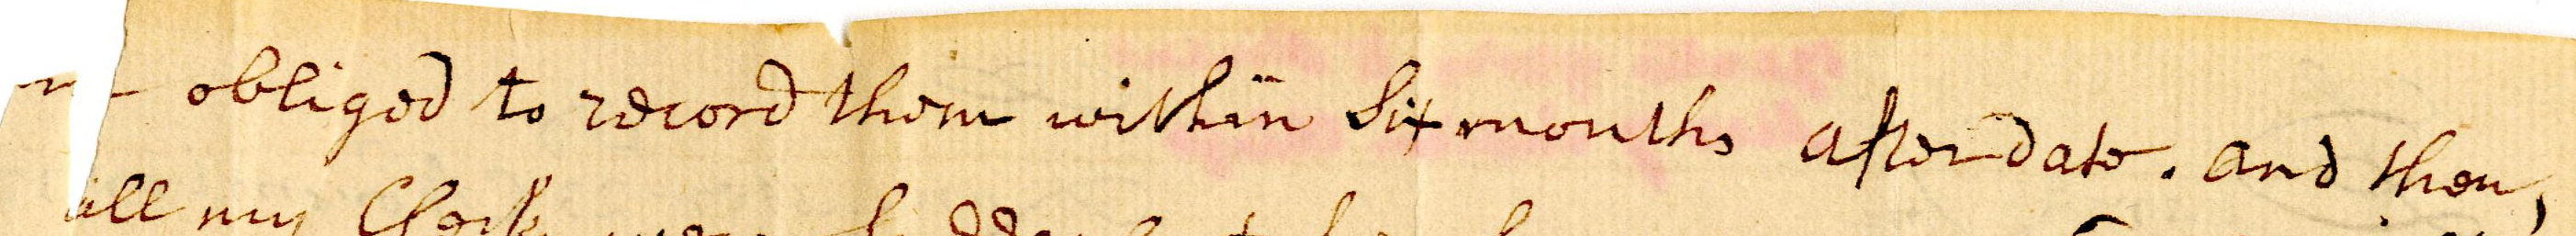[ _] obliged to record them within six months after date. And then,
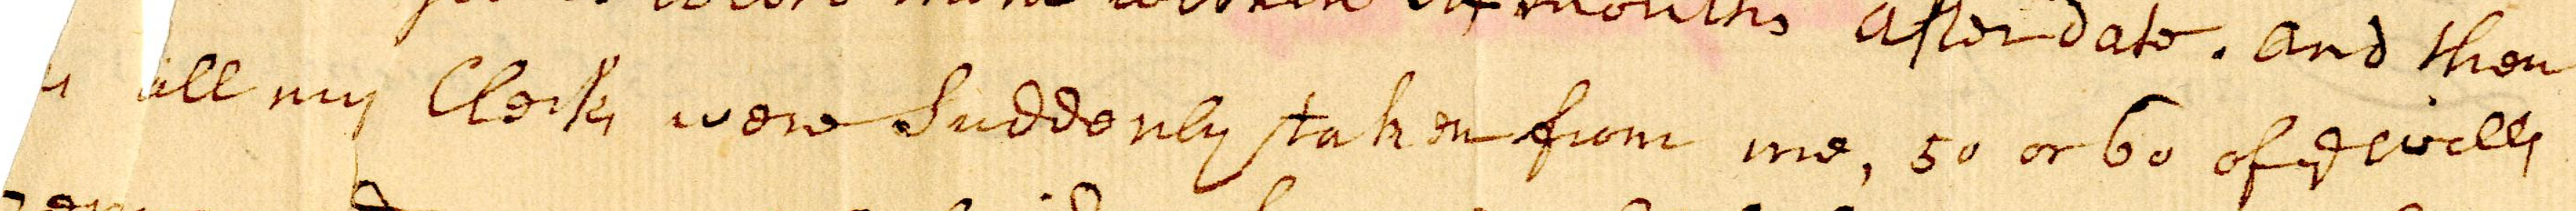[__] all my Clerks were Suddenly taken from me, 50 or 60 of y^e civilly
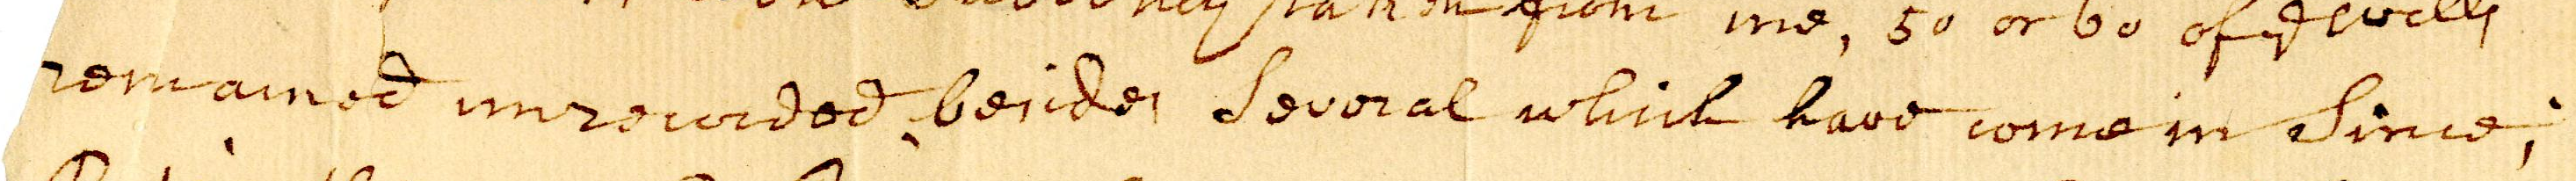remained unrecorded, besides several which have come in since;
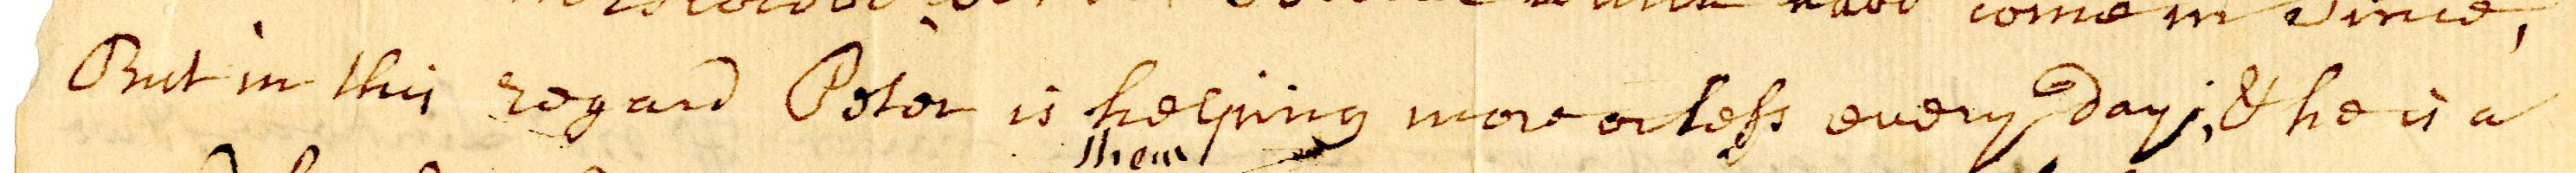But in this regard Peter is is helping more or less every day; & he is a
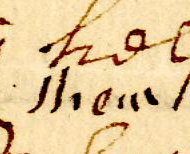them
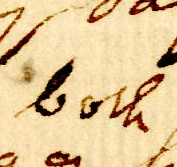both
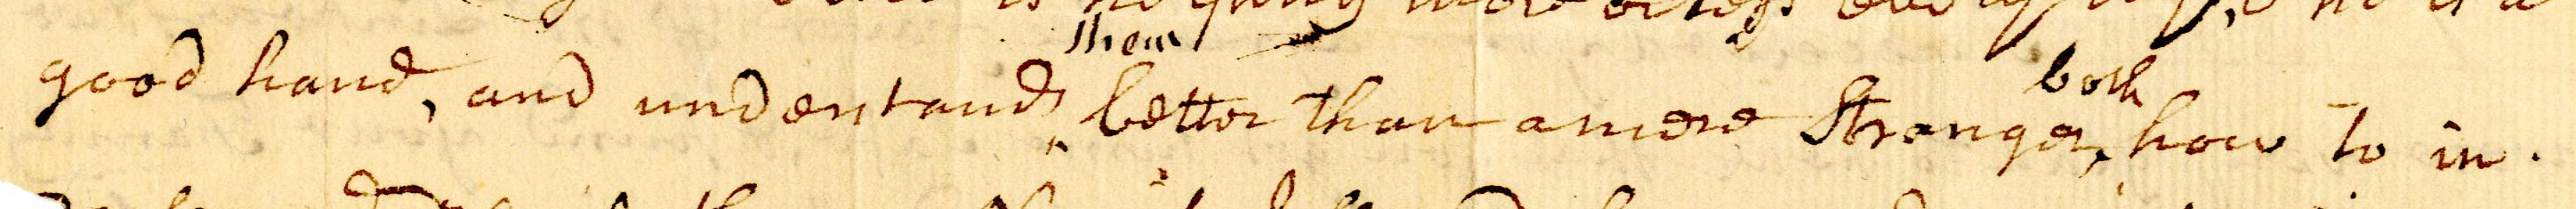good hand, and understands better than a mere Stranger, how to in.
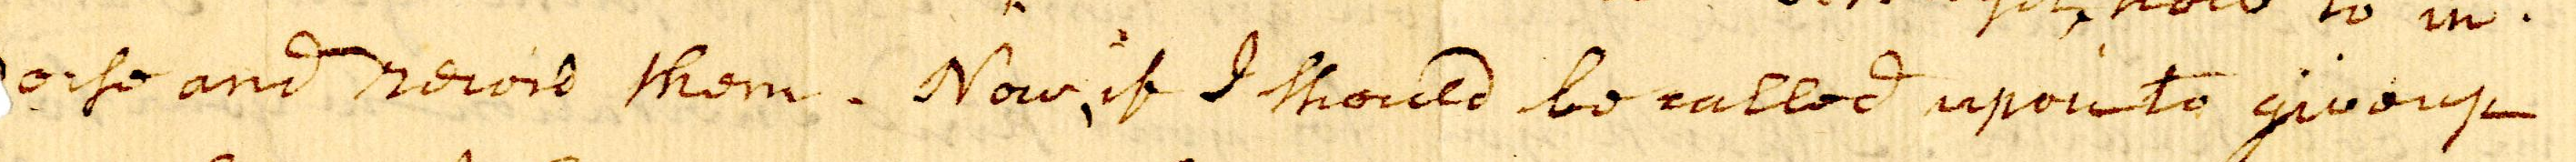[_]rse and record them. Now, if I should be called upon to giving
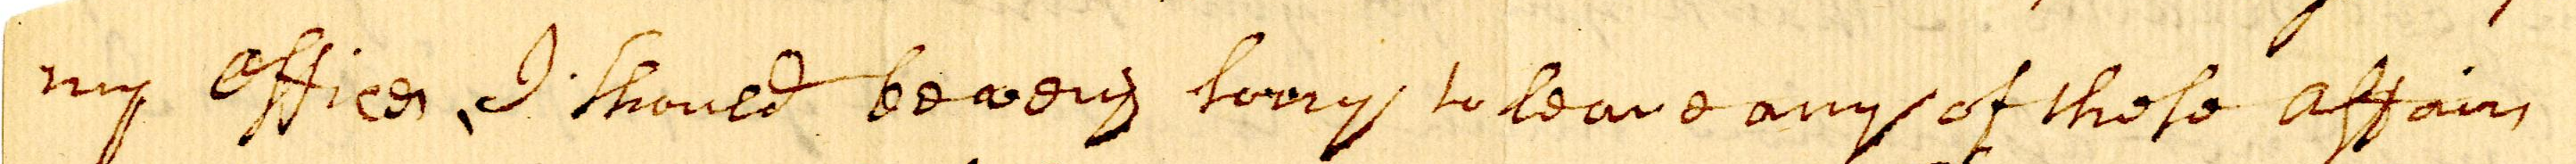my Offices, I should be very sorry to leave any of these affairs
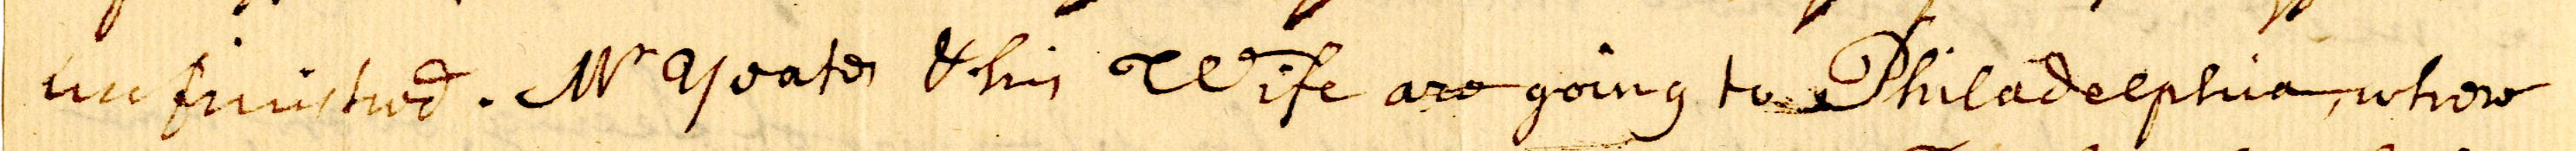unfinished. M^r Yeates & his Wife are going to Philadelphia, where
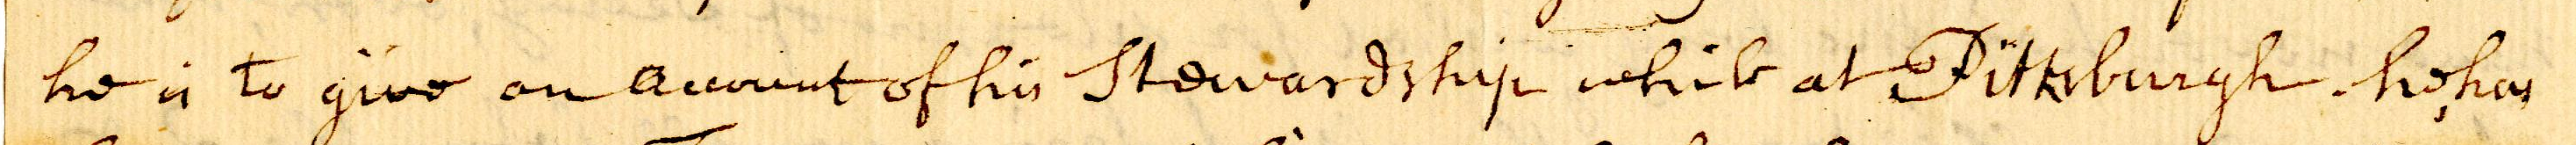he is to give an Account of his Stewardship while at Pittsburgh. he has
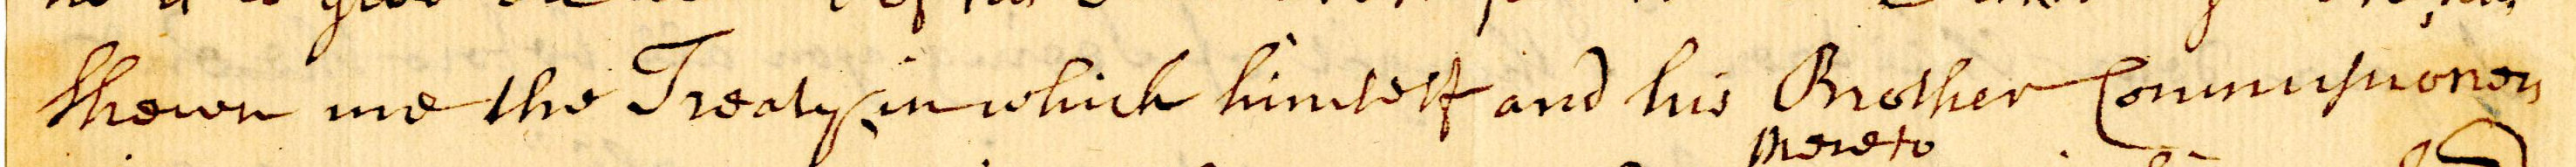shown me the Treaty, in which himself and his Brother Commisioner
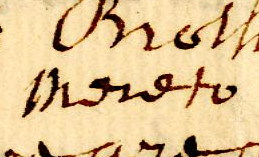thereto
